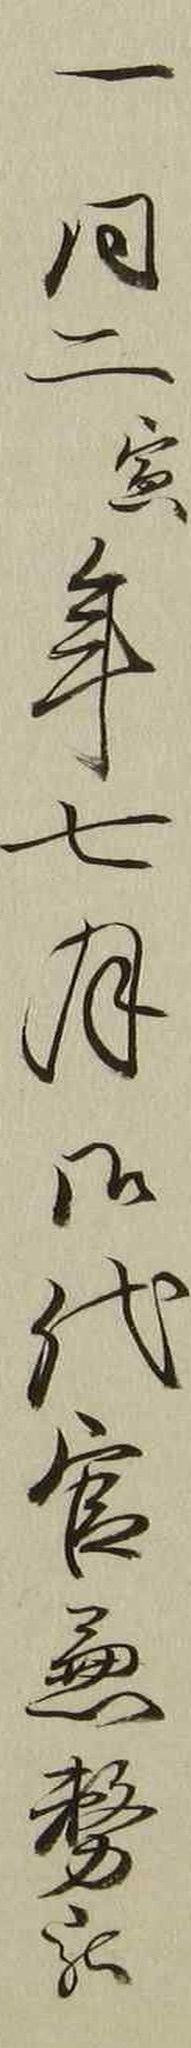一同二寅年七月御代官兼務被
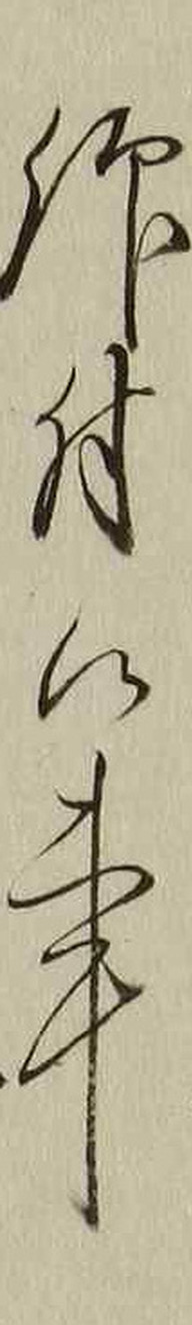仰付候事
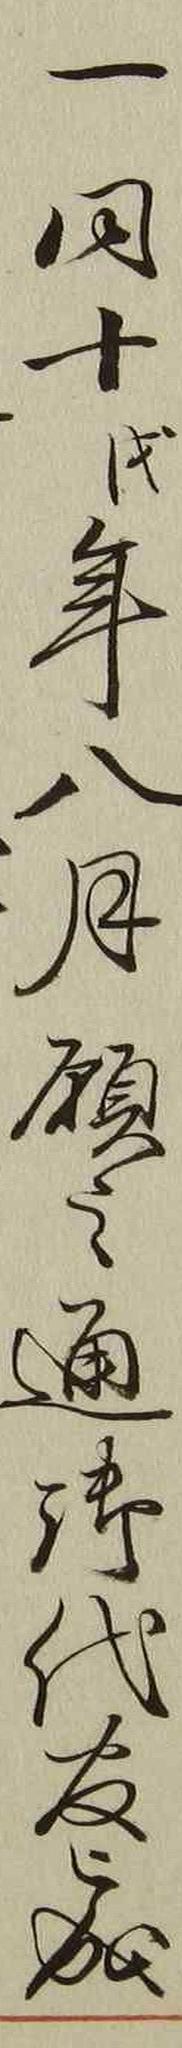一同十戌年八月願之通御代官被成
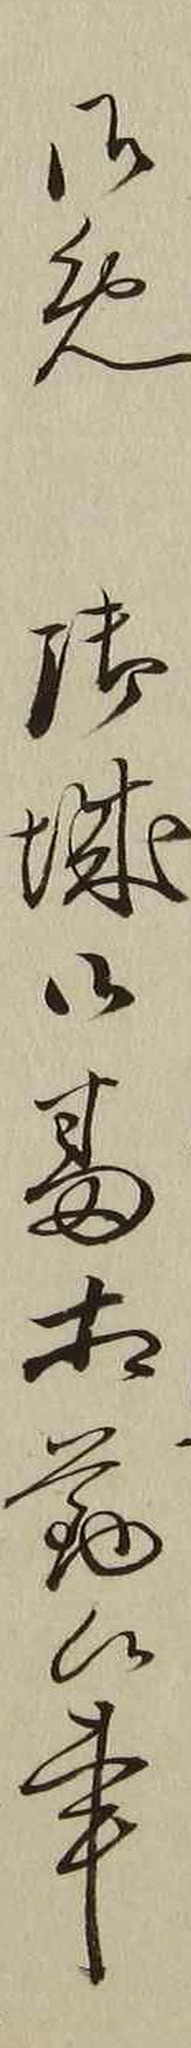御免御城御番相勤候事
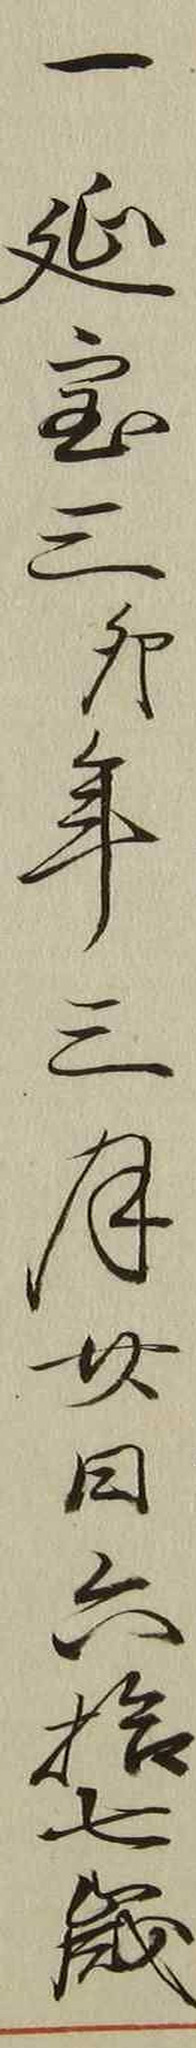一延宝三卯年三月廿日六拾七歳
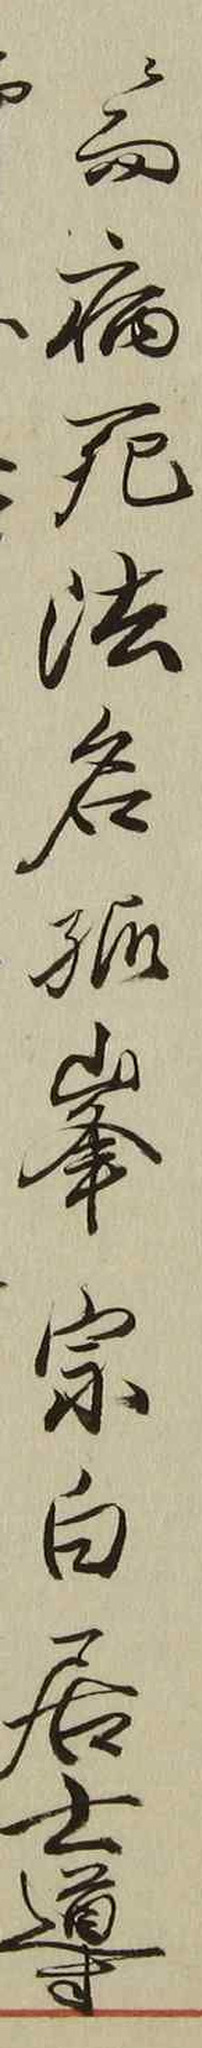ニ而病死法名弧孤峯宗白居士導
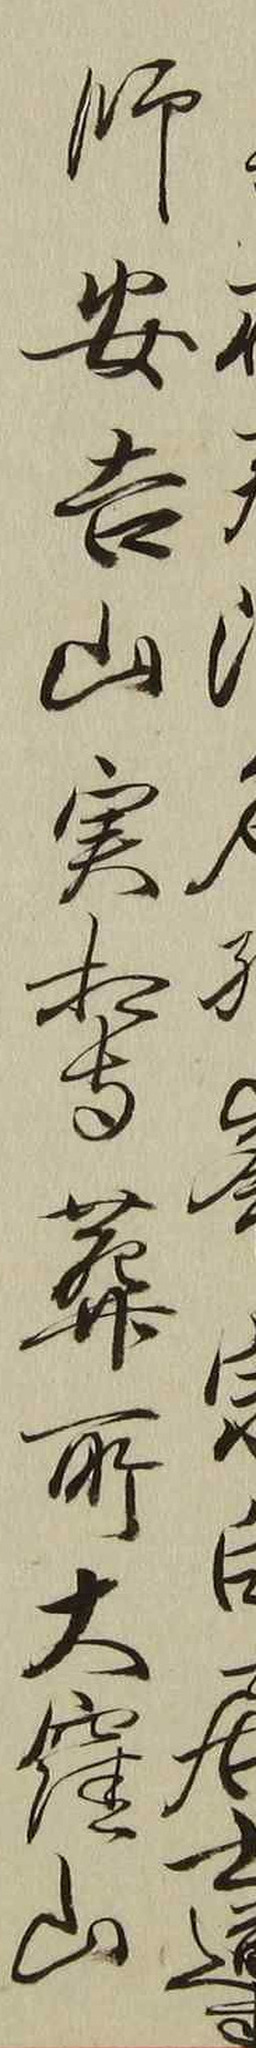師安吉山実相寺葬所大窪山
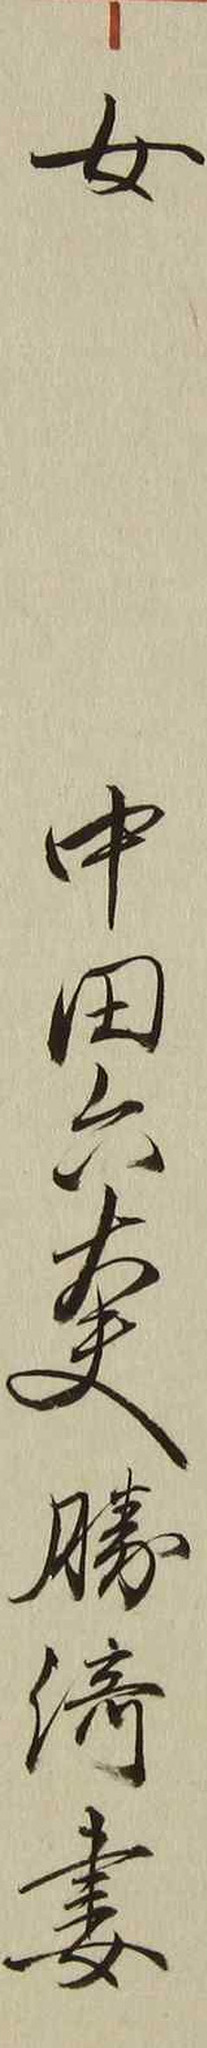女中田六大夫勝倚妻
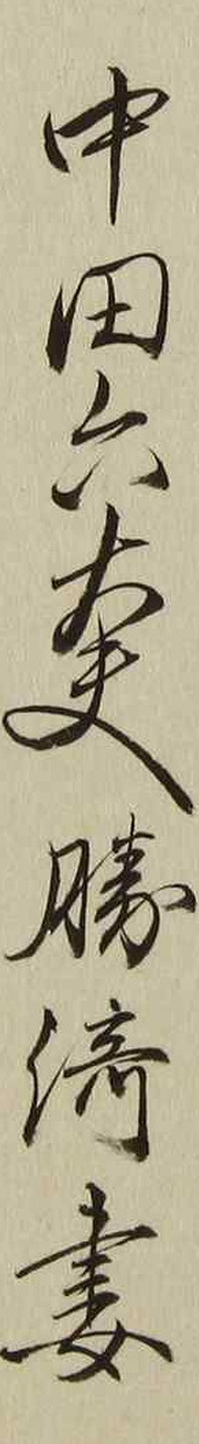女中田六大夫勝倚妻
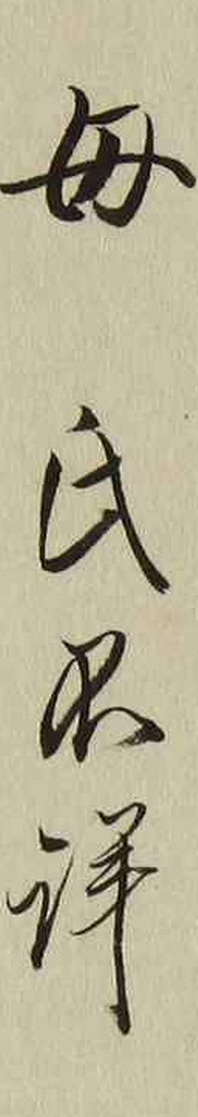母氏不詳
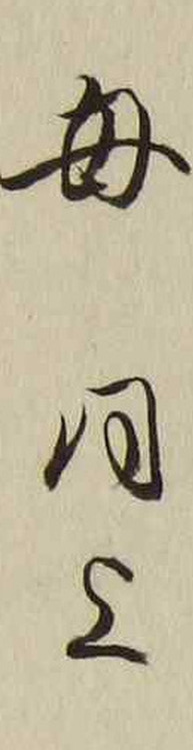母同上

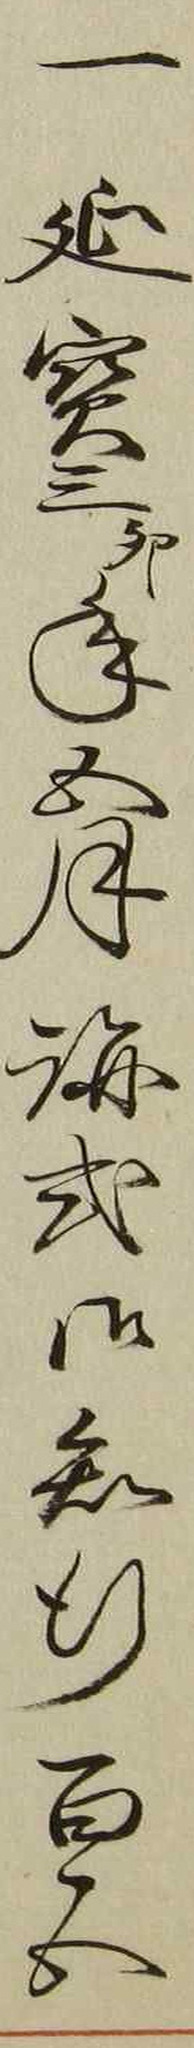一延宝三卯年五月跡式御知行百五
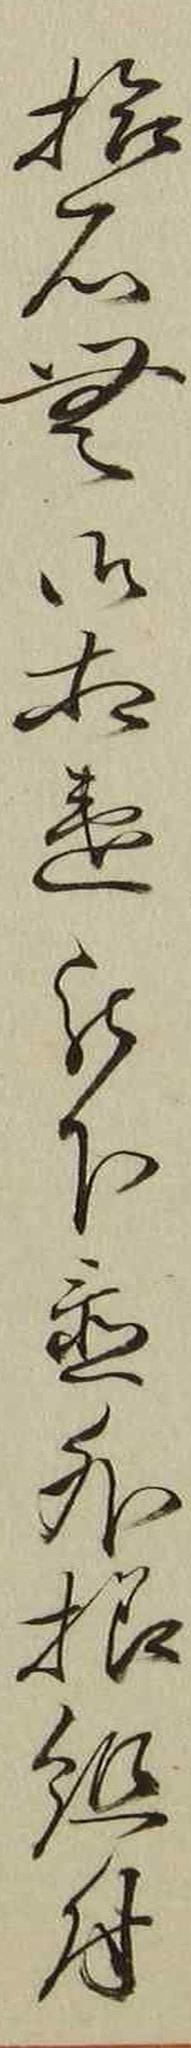拾石無御相違被下置外様組付
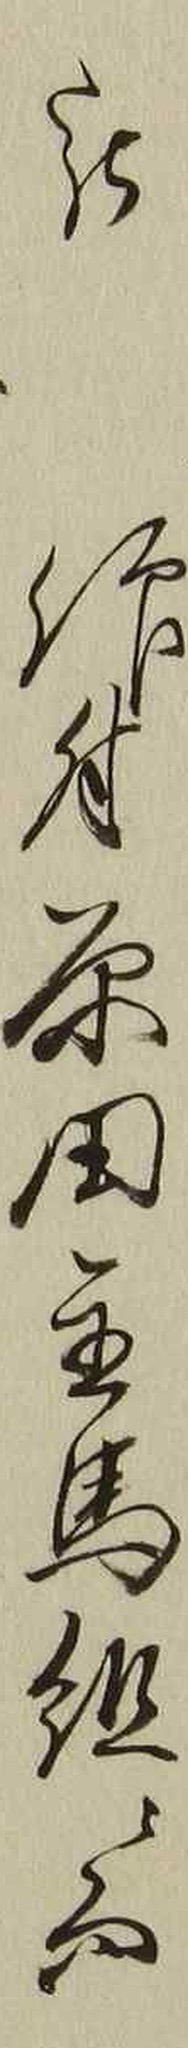被仰付原田主馬組ニ而
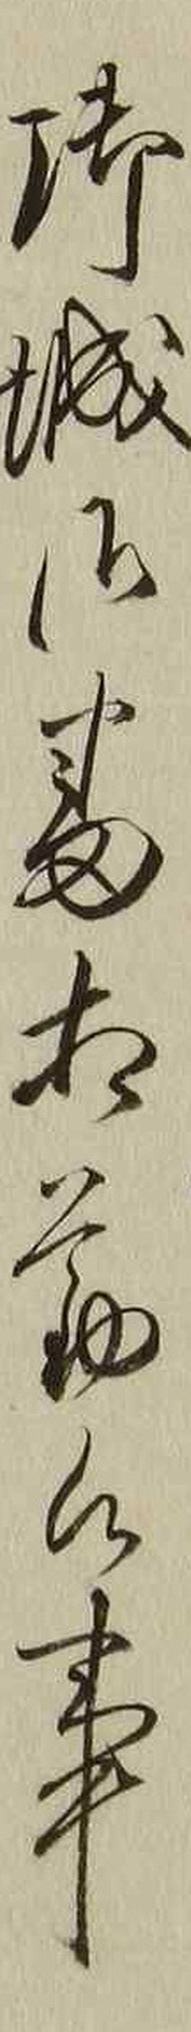御城御番相勤候事
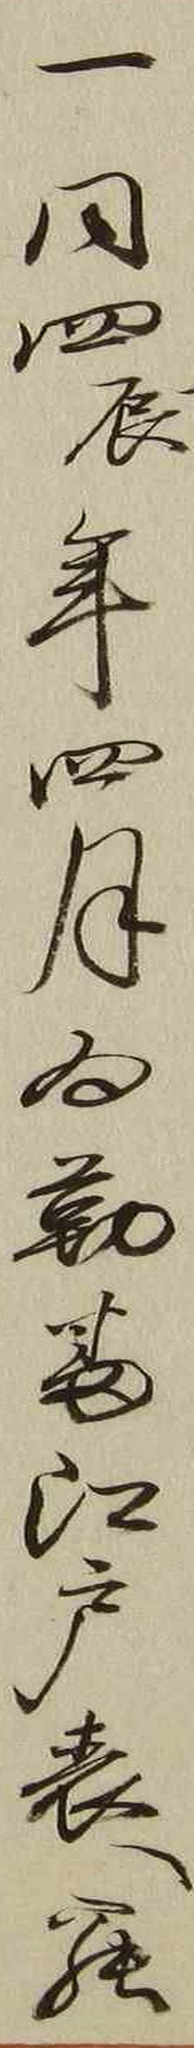一同四辰年四月為勤番江戸表へ罷
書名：諸士系譜　巻之54　ほ之部1
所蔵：会津若松市立会津図書館
